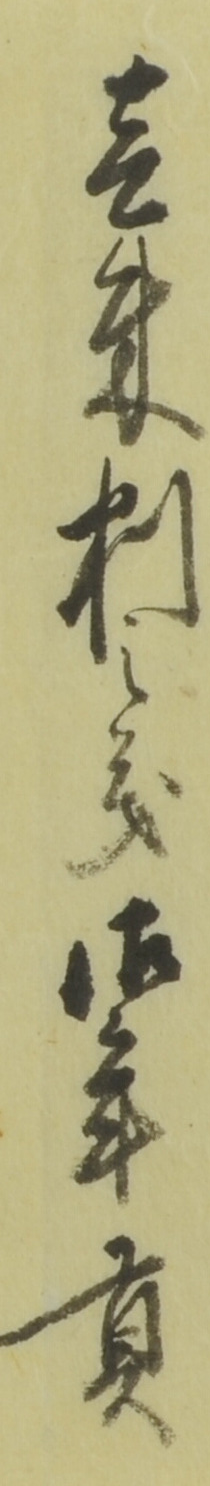壱朱判之義御年貢
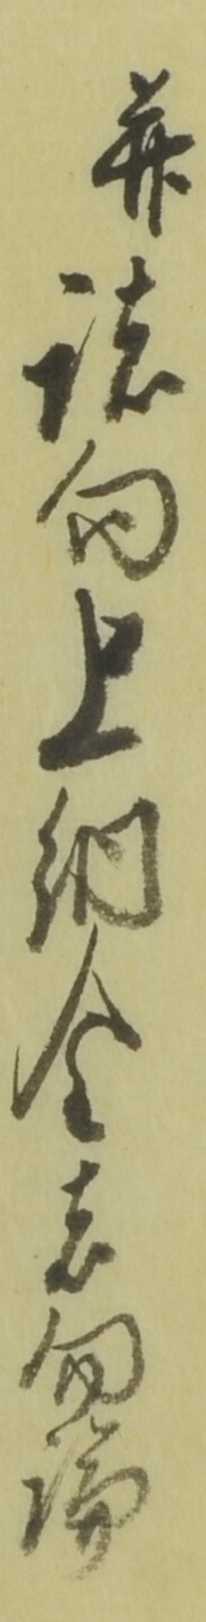并諸向上納金は勿論
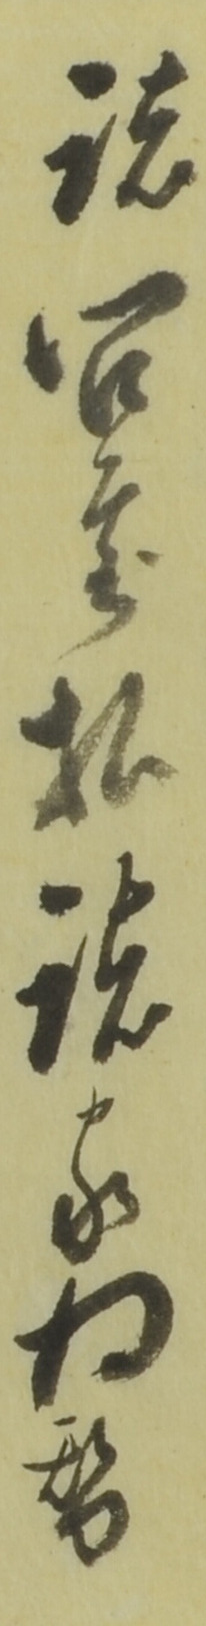諸問屋払諸家為替
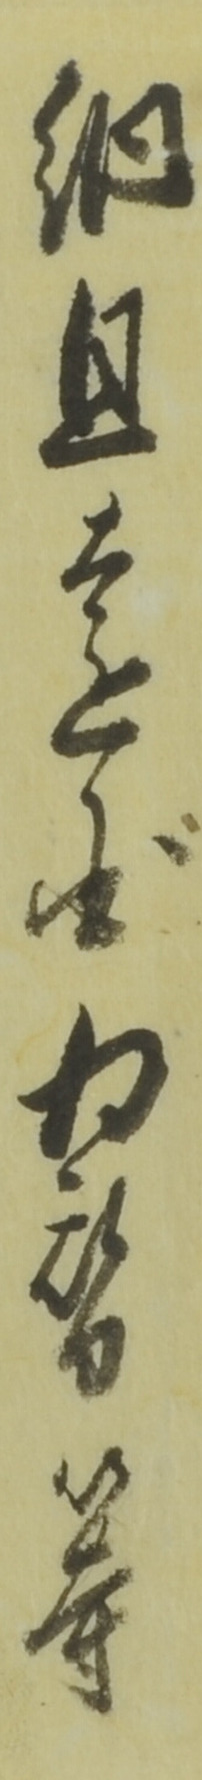納且遠国為替等
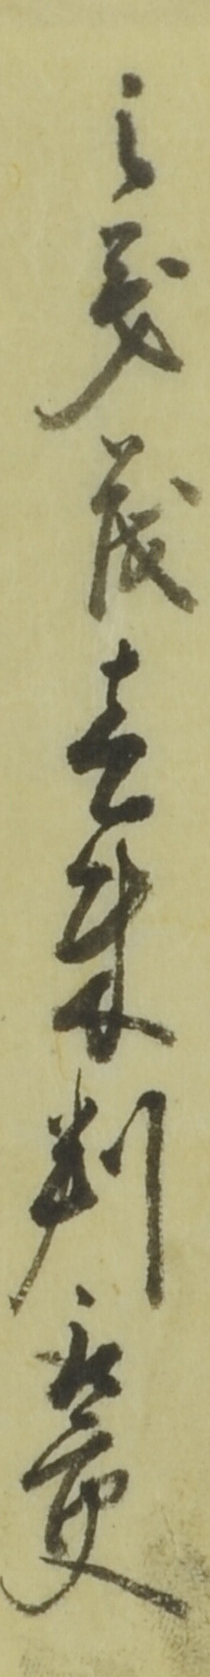之義も壱朱判取交
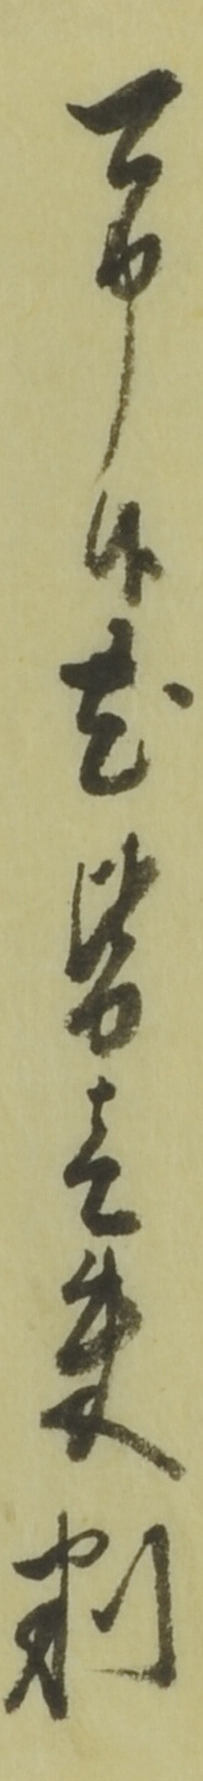可申候尤皆壱朱判
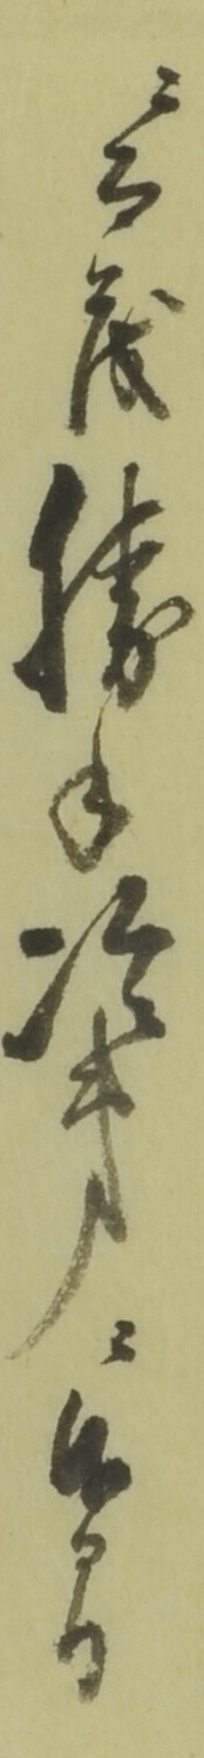ニ而も勝手次第ニ候間
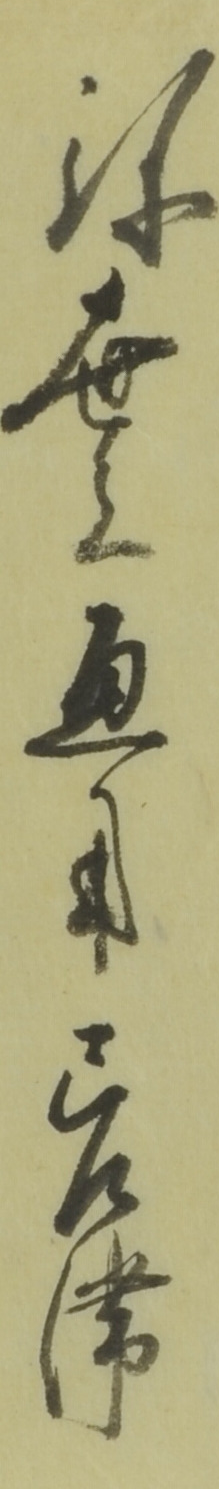弥世上通用差滞
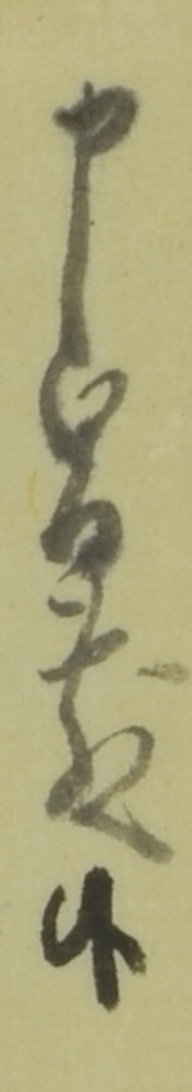申間敷候
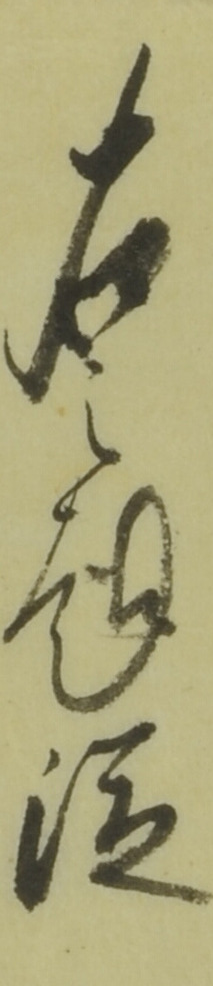右之趣従
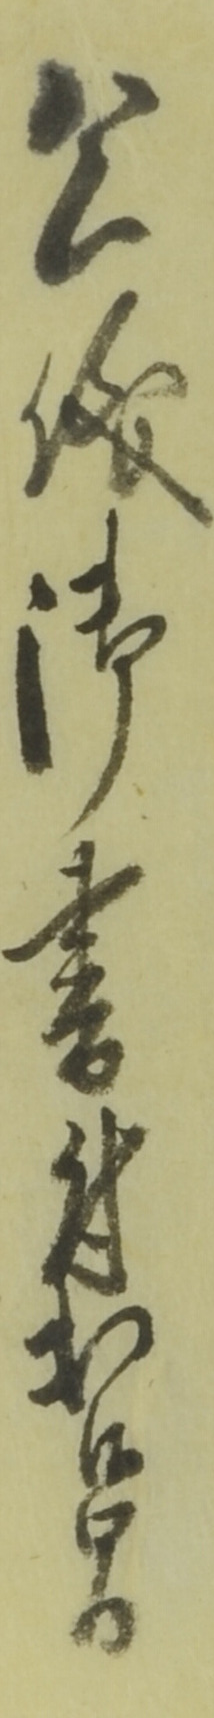公儀御書付出候間

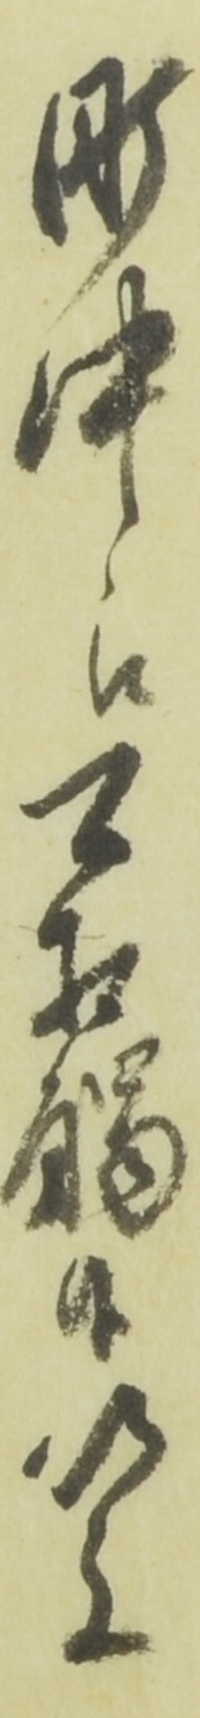町中江可相触候以上
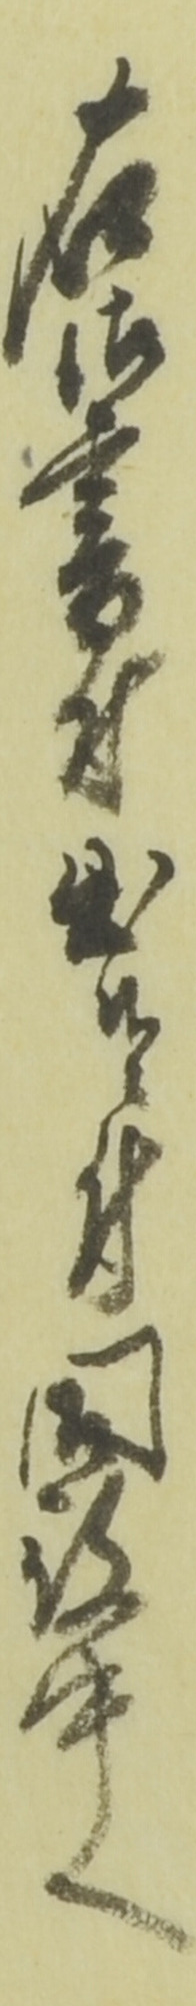右御書付出候ニ付同役中へ
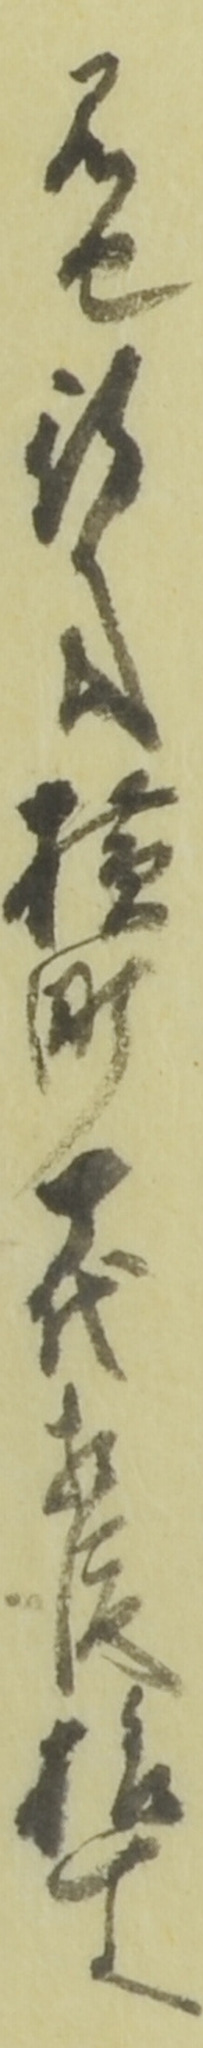見せ行司横町丁代相渡拾丁へ
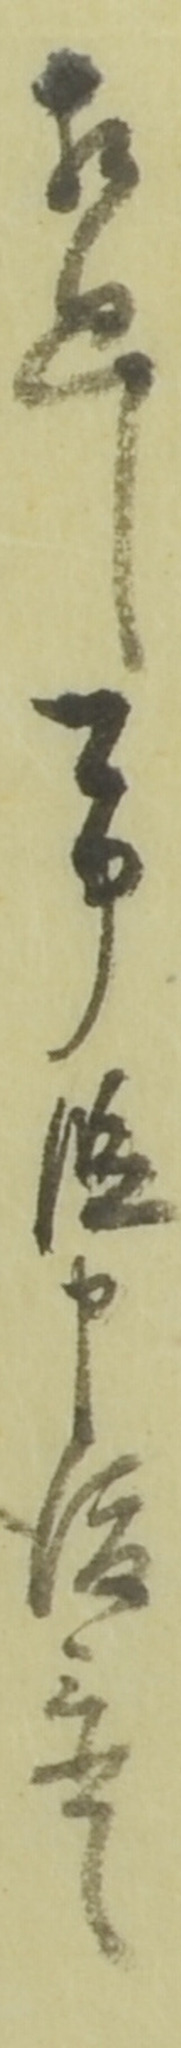相廻し可申段申渡置候
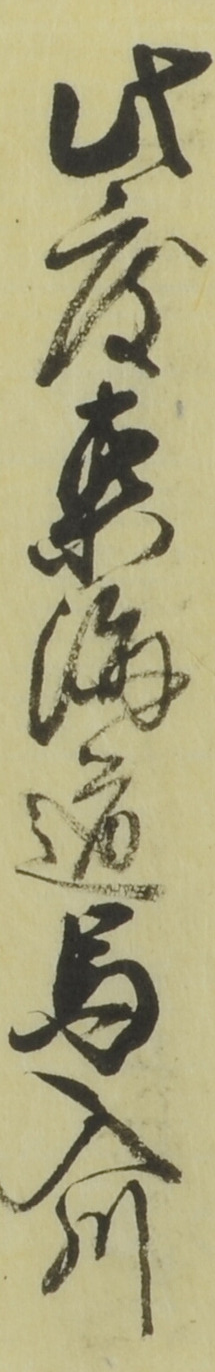此度東海道馬入川
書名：御触書御書附控
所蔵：伊那市立高遠町図書館・合同会社AMANE
